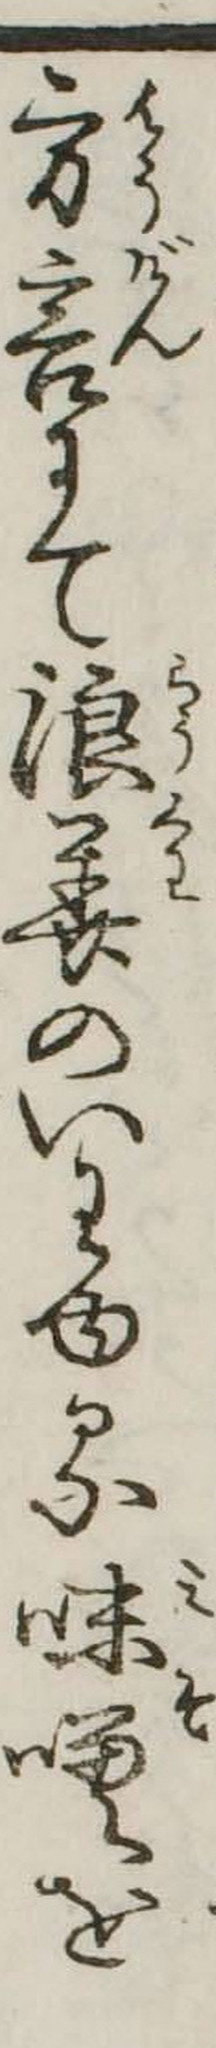方言にて浪華のいわゆる味噌を
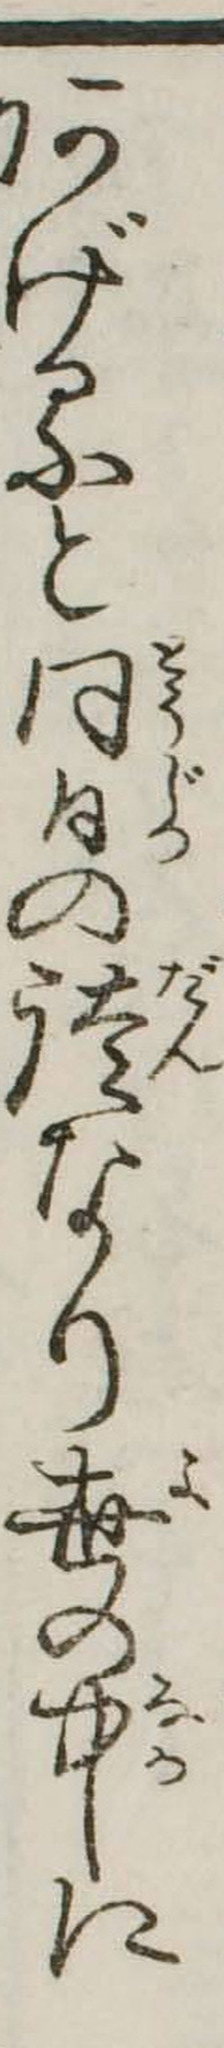あげると同日の談なり世の中に
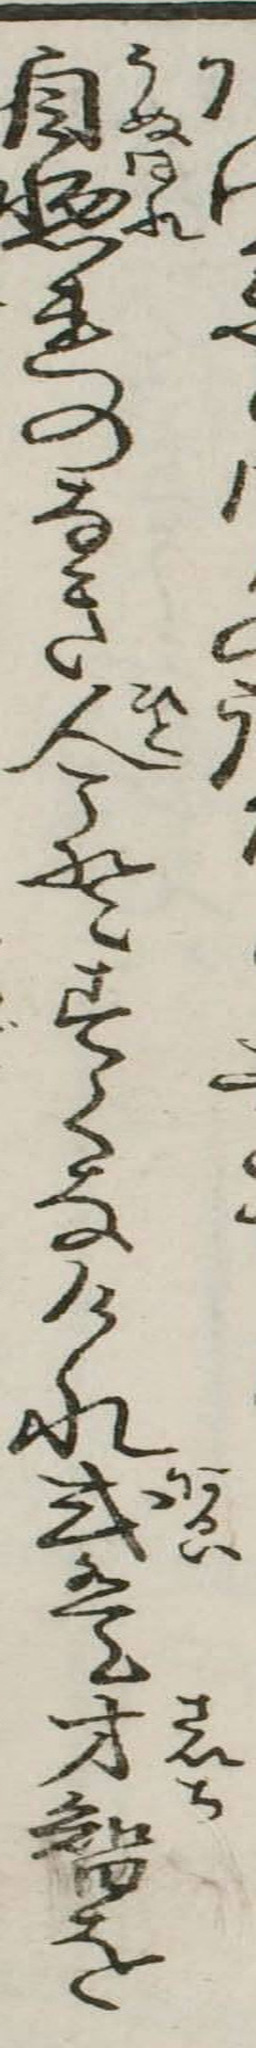自惚れのなき人こそすくなけれ或は才智を
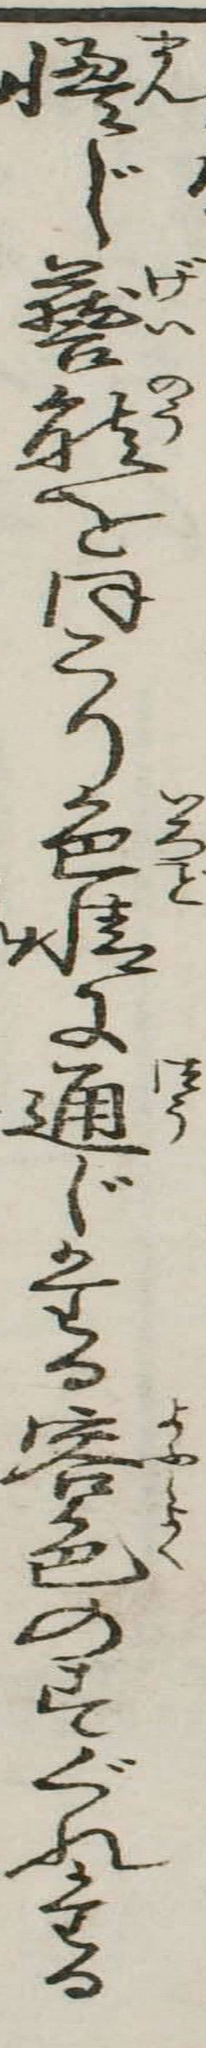慢じ芸能をほこり色情に通じたる容色のすぐれたる
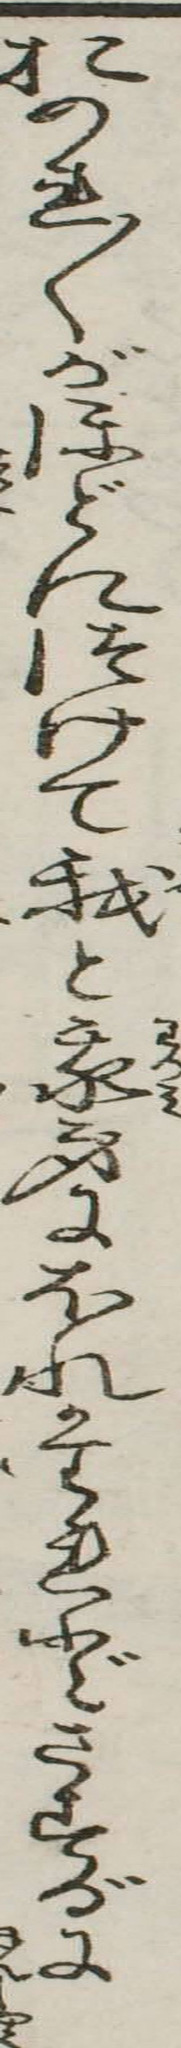おのれ〳〵がほどにつけて我と我身にほれたれどさすがに
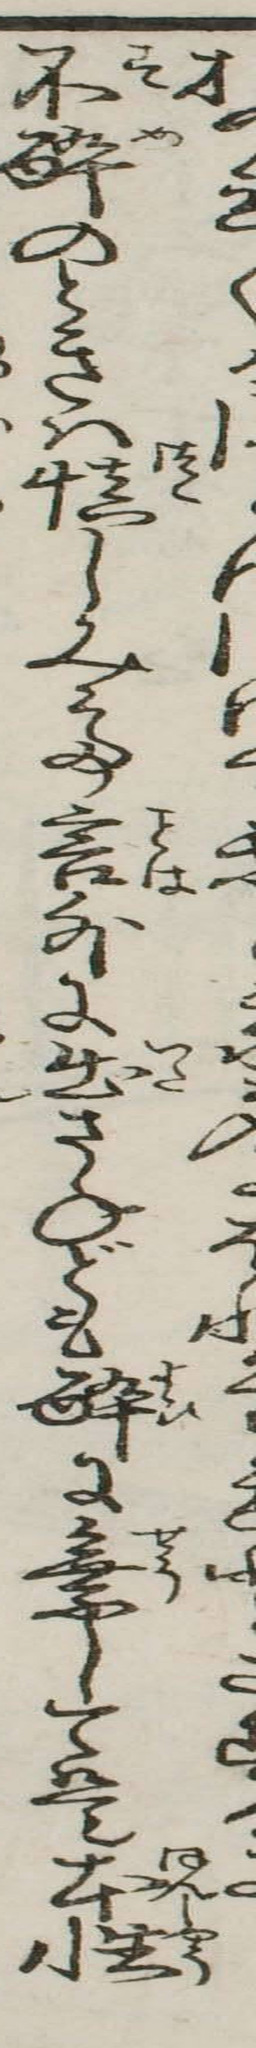不酔のときは慎しみて言外に出さねども酔に乗じては本性
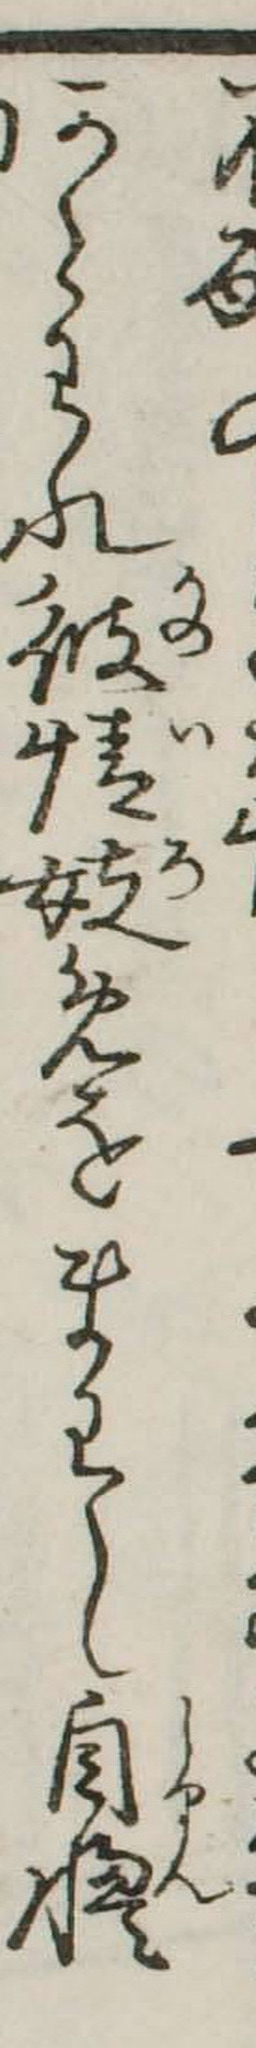あらわれ彼情妓めをまわし自慢
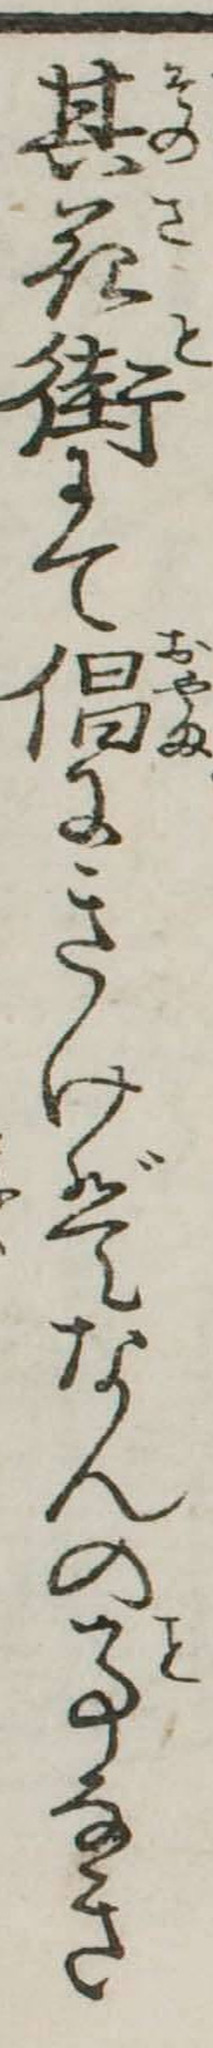其花街にて倡にきけばなんの事なき
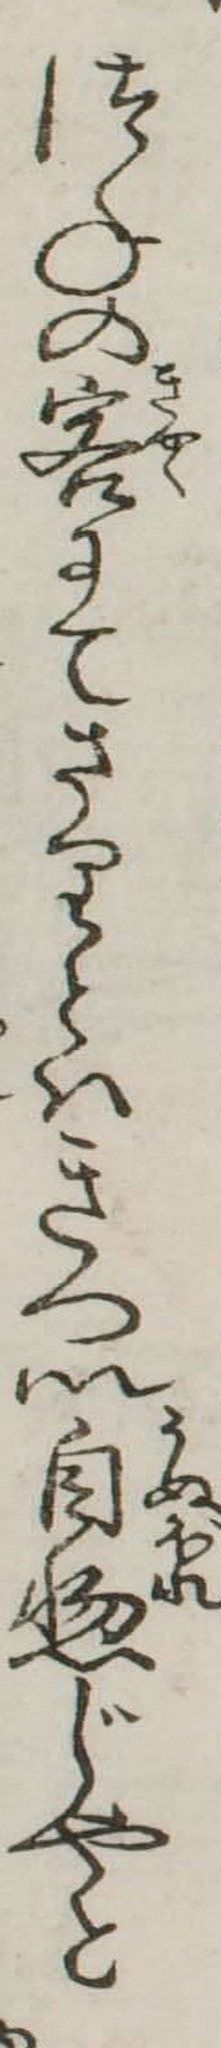つねの客にてさりとはきつい自惚じやと
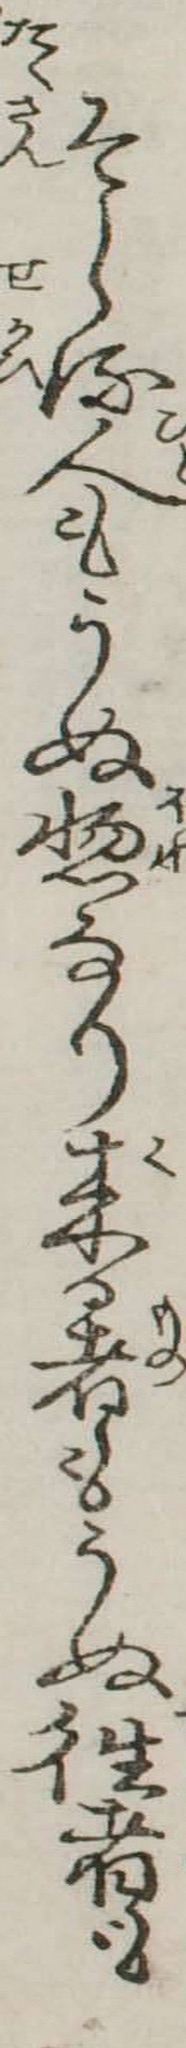そしる人もうぬ惚なり来る者もうぬ往者も
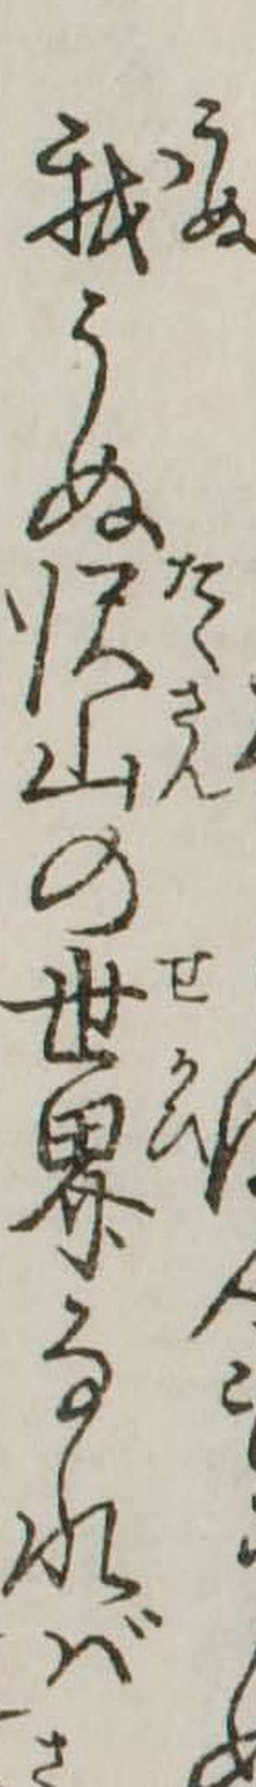我うぬ沢山の世界なれば
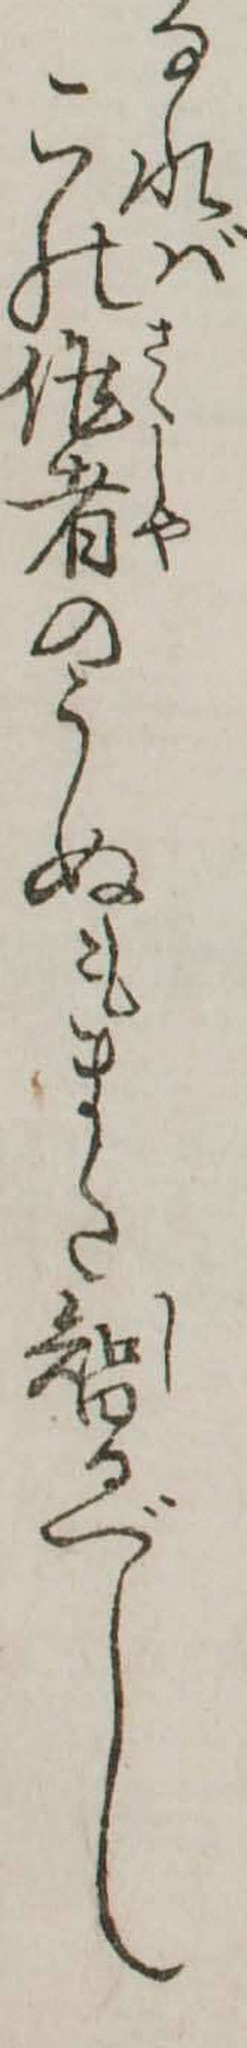この作者のうぬもまた智るべし

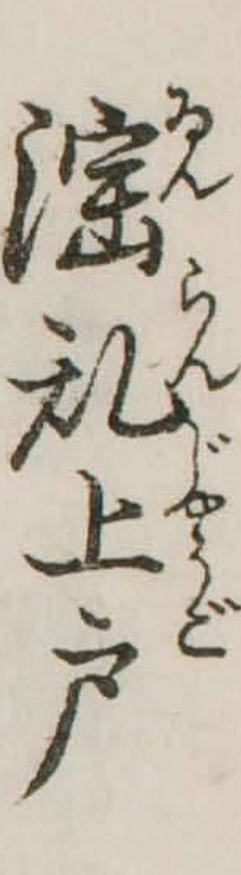淫乱上戸
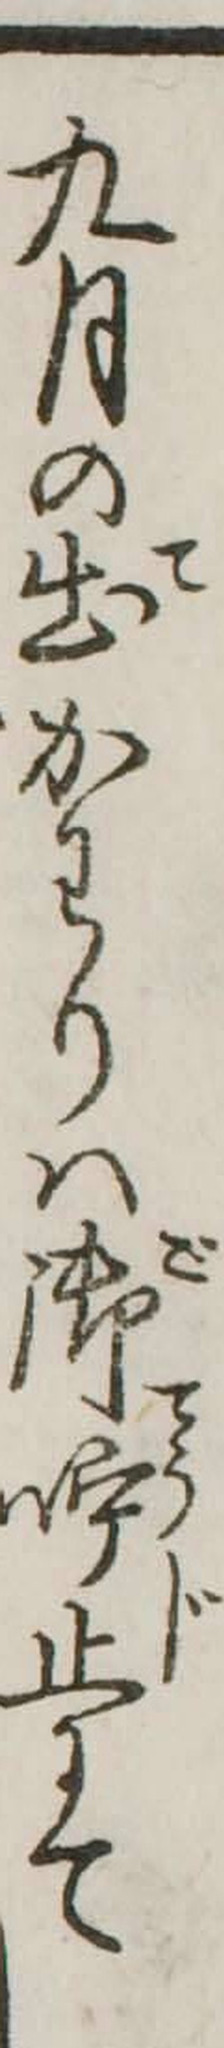九月の出かわりは御停止にて
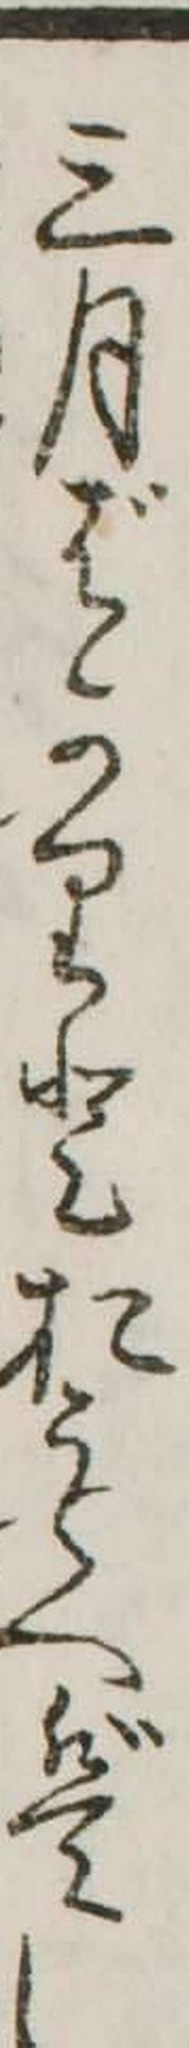三月ばかりとおもへば
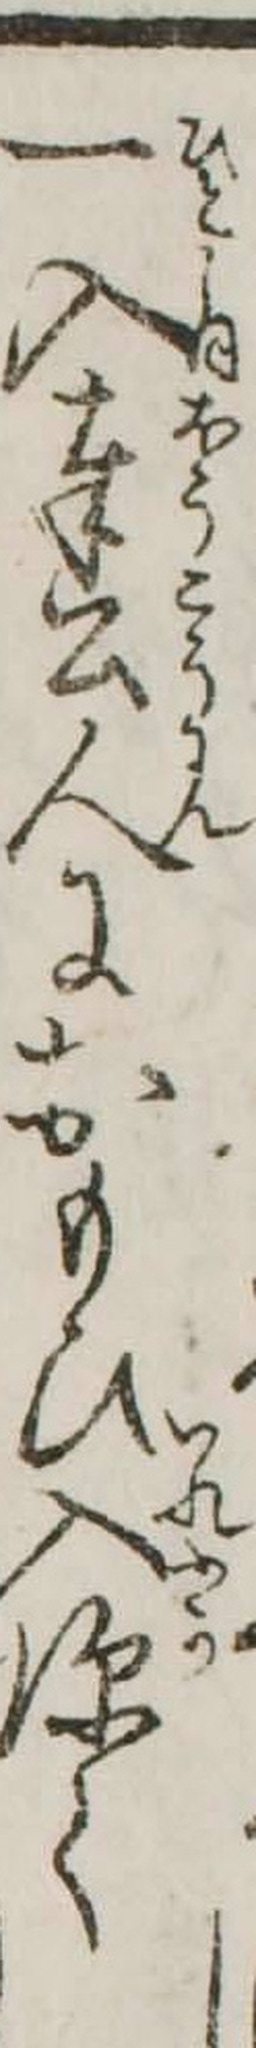一入奉公人におもひ入深く
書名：繪本不盡泉
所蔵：国文学研究資料館
